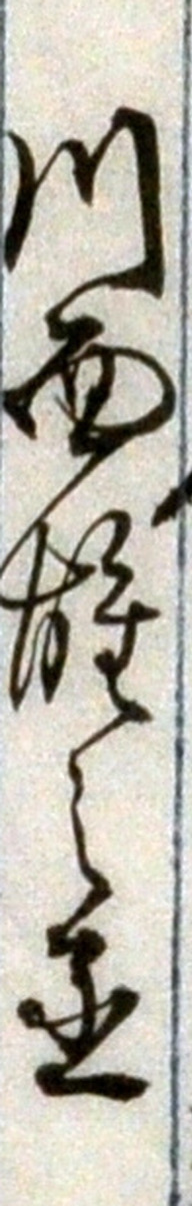川面雄之丞
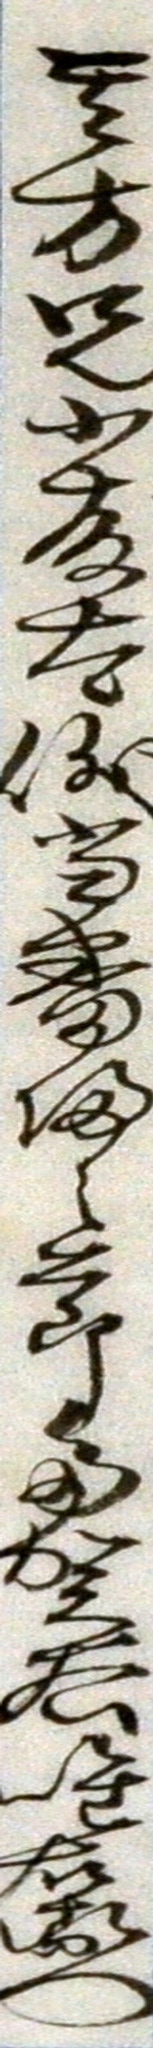其方兄小藤太儀當番帰之節多賀谷唯右衛門
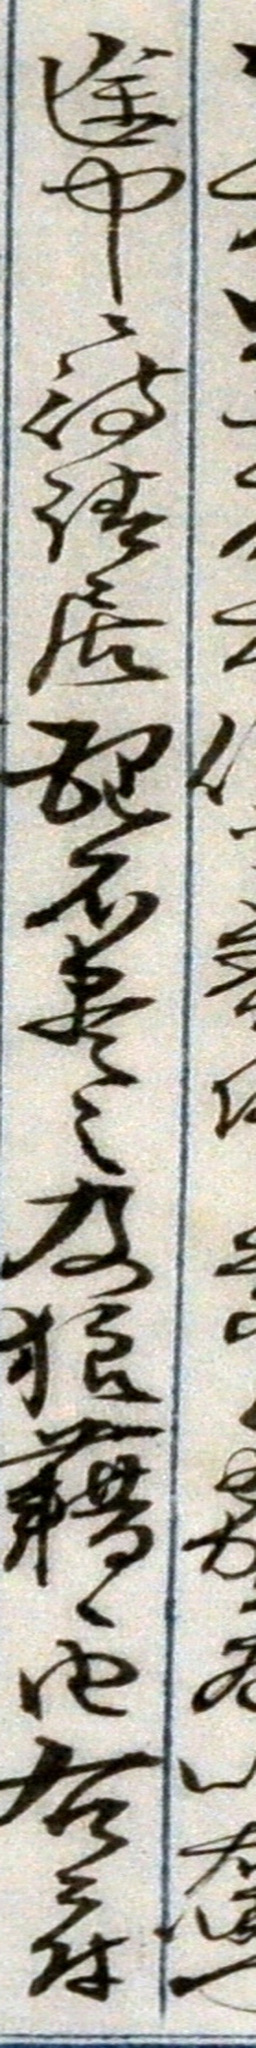途中ニ待請居理不尽之及狼藉候由右ニ付
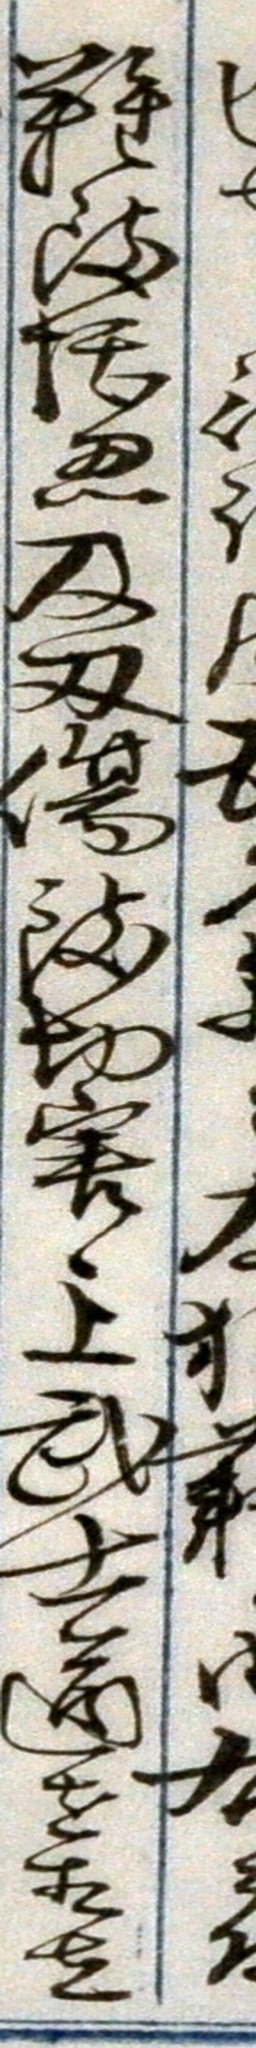難致堪忍及刃傷致切害候上武士道を相立
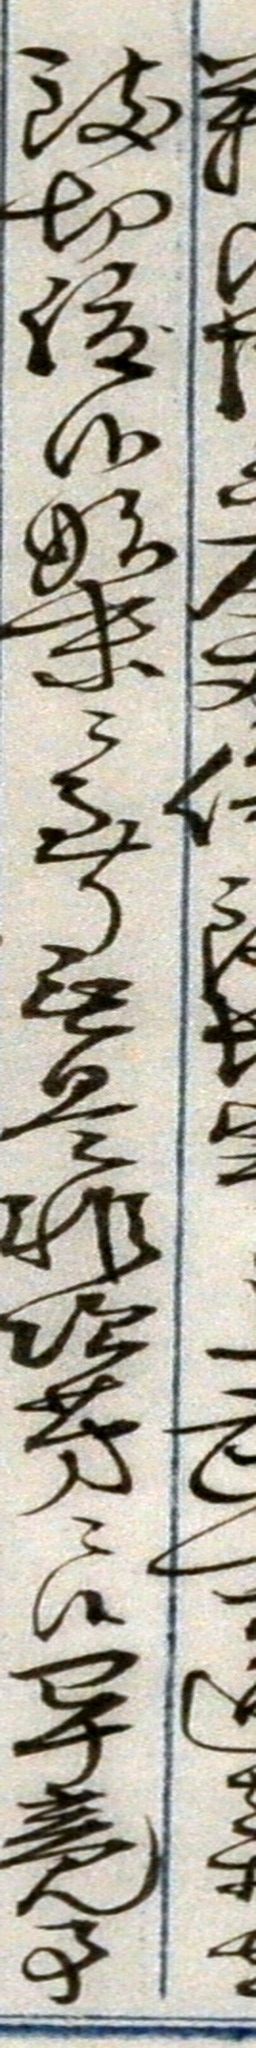致切腹候始末ニ至り無是非次第ニ候畢竟事
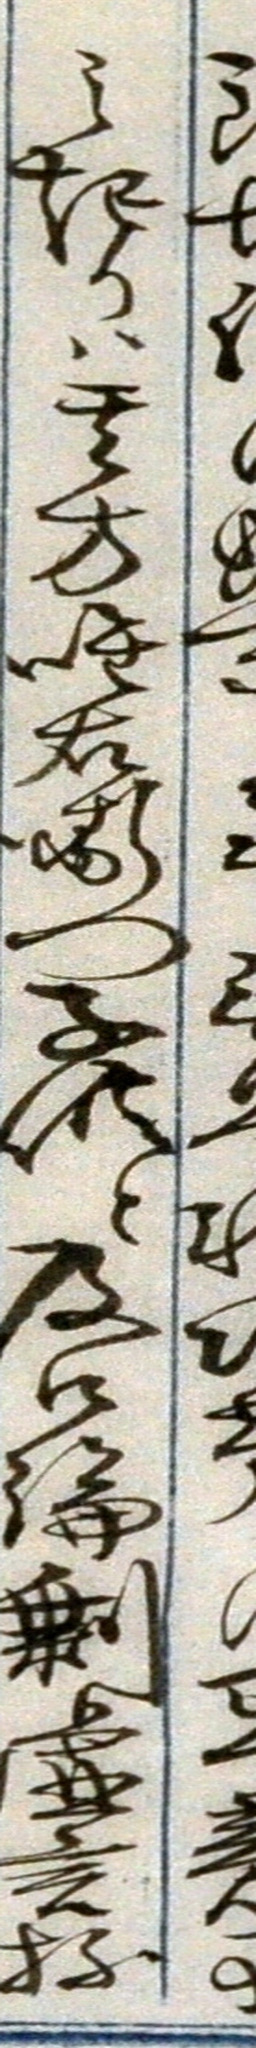之起りハ其方唯右衛門子供と及口論剰虚言抔
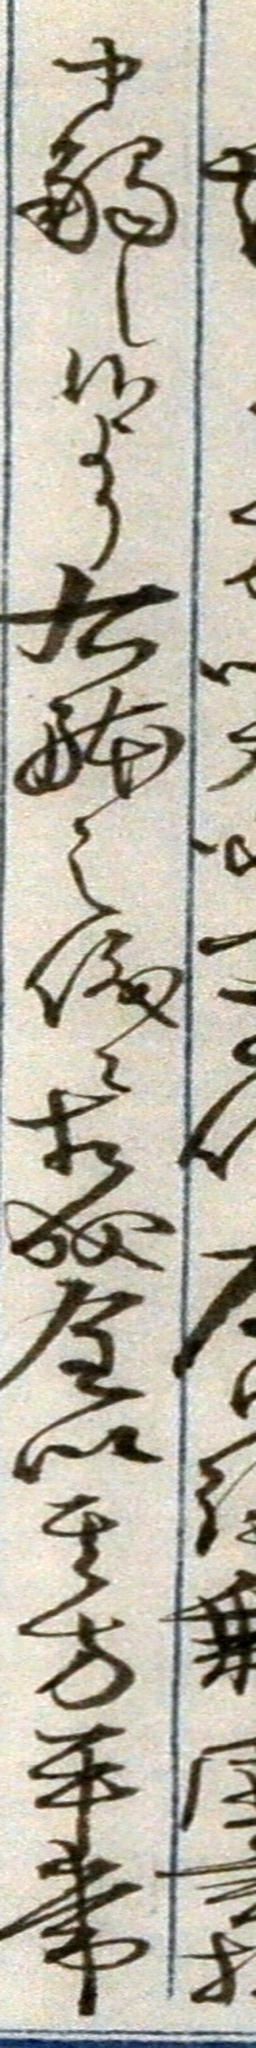申触之候より右躰之儀ニ相成全以其方平常
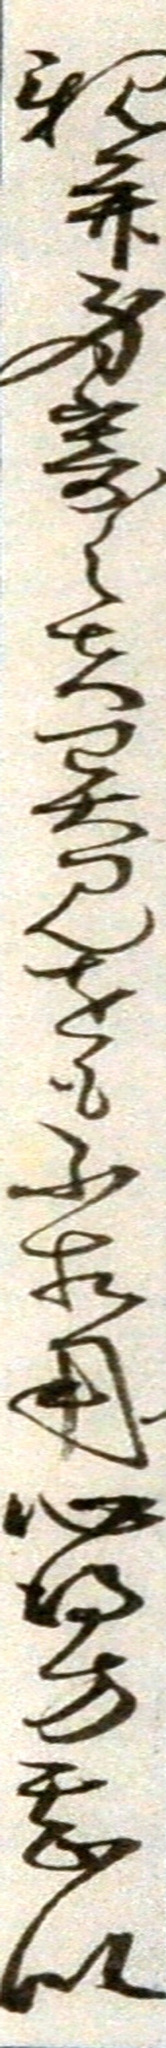親幷身寄之者異見をも不相用心得方甚以

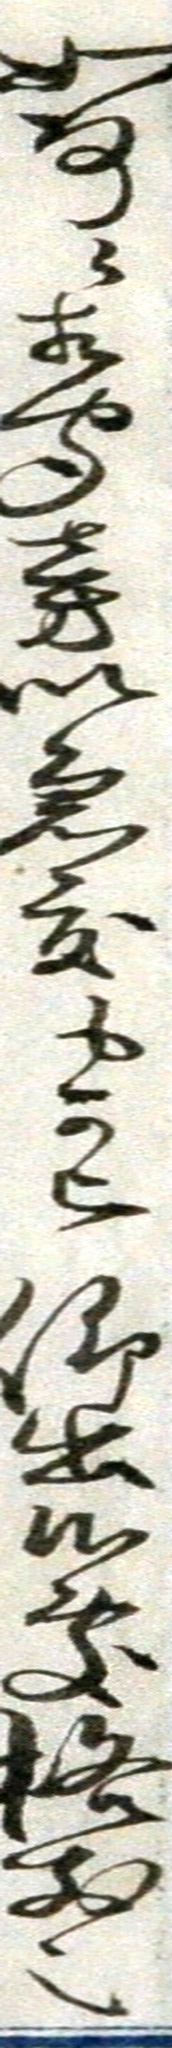如何ニ相聞旁以急度も可被仰出候處格別之
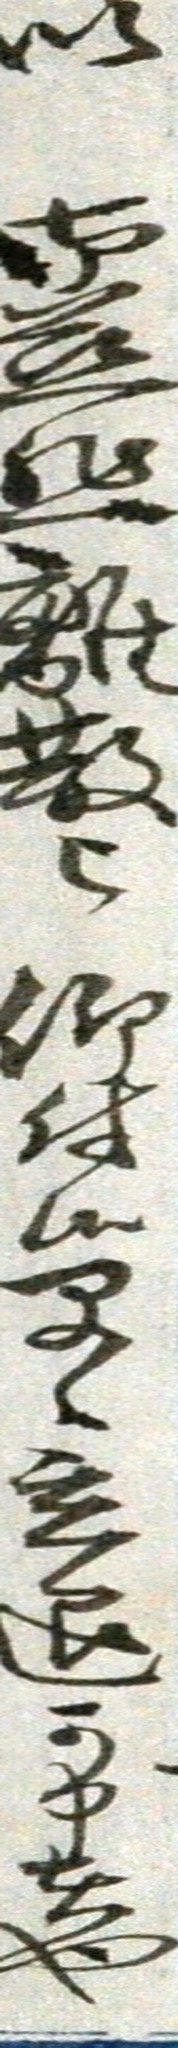以御慈悲離散被仰付候早々立退可申者也
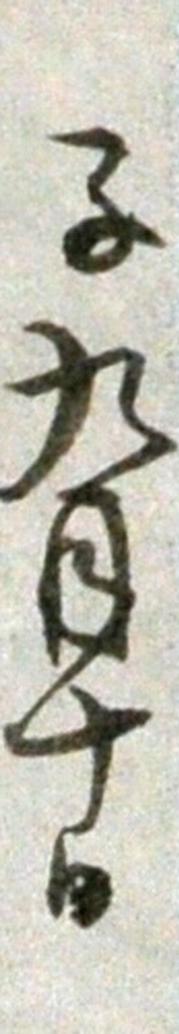子九月十日
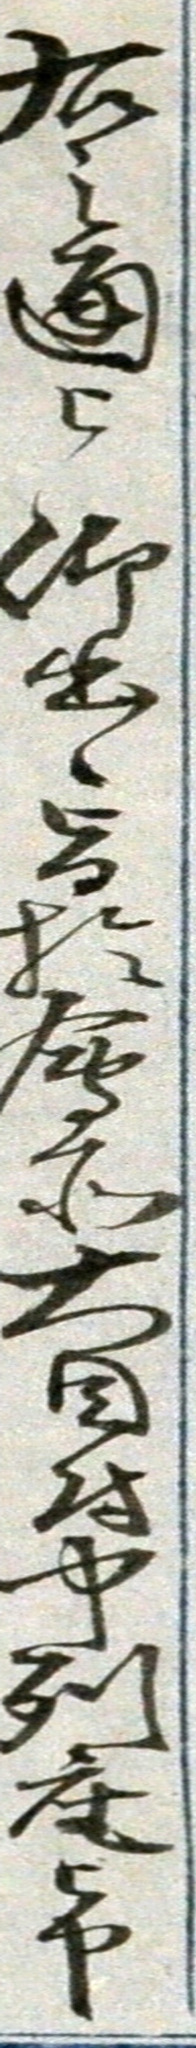右の通被仰出候旨於会所大目付中列座被申
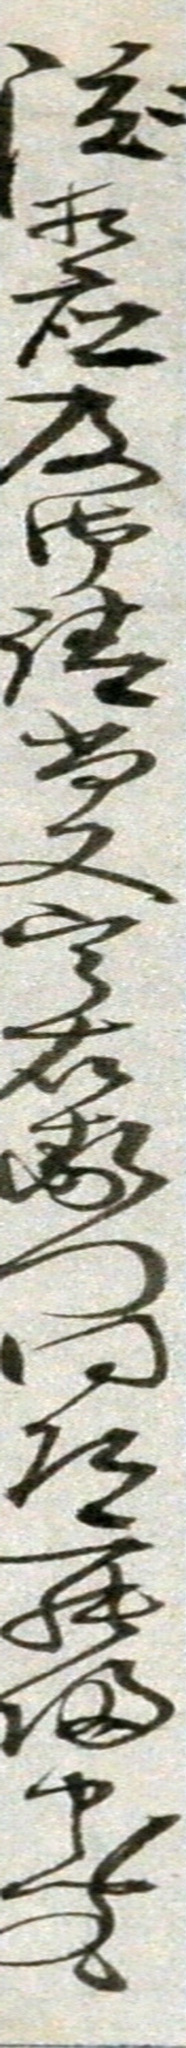渡相応及御請尚又宇右衛門同道罷帰申聞候
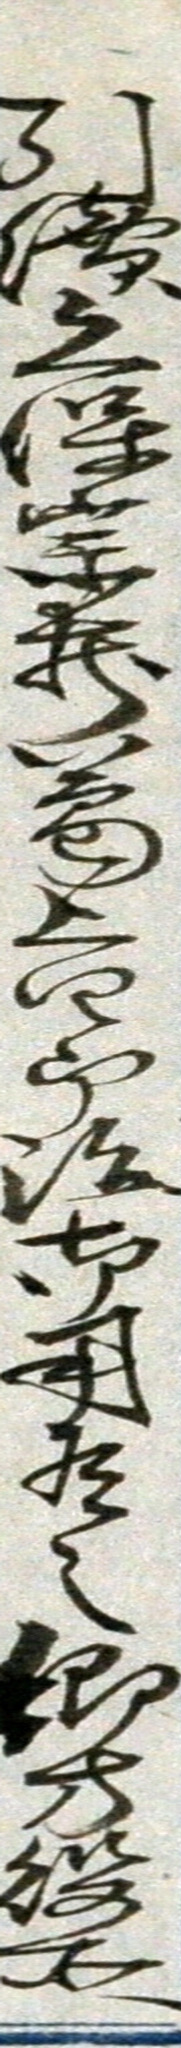一引續久保宗蔵葛上四郎治御用有之郷方役所へ
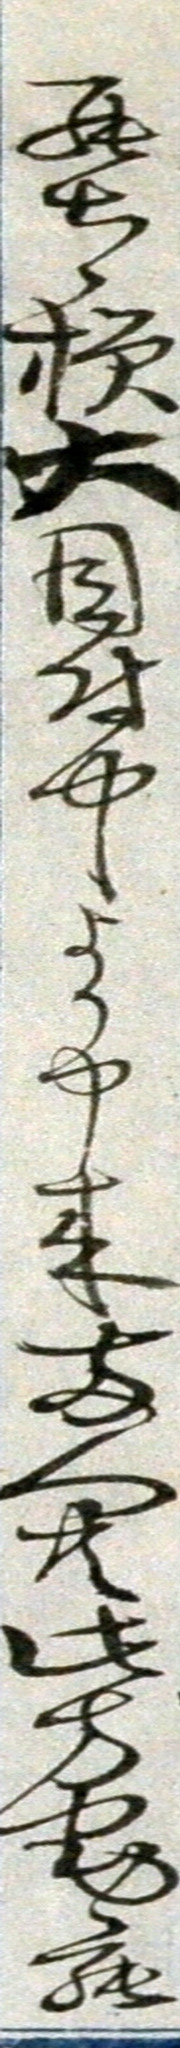罷出候様大目付中より申来両人共此方宅ニ罷
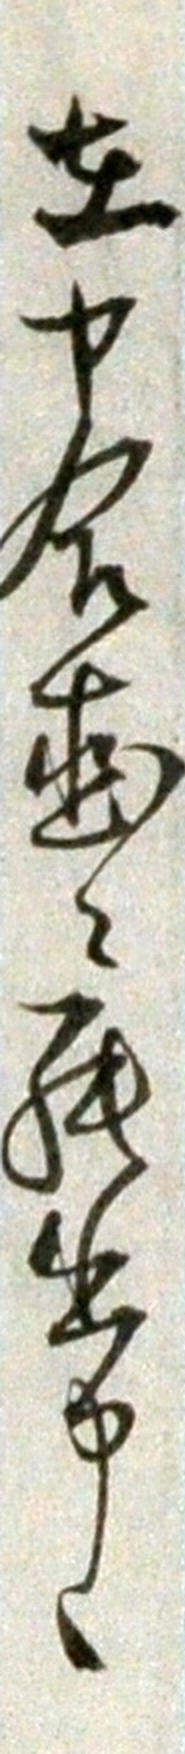在申合直ニ罷出申候
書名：川面小藤太子細有之多賀谷唯右衛門ヲ打果候一件
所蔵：伊那市立高遠町図書館・合同会社AMANE
